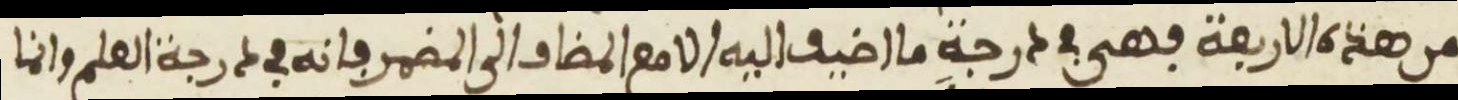من هذه الاربعة فهي في درجة ما اضيف اليه الا مع المضاف الى المضمر فانه في درجة العلم و انما
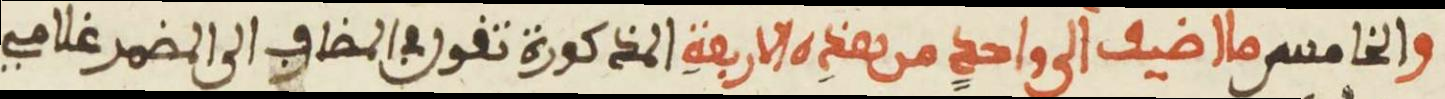و الخامس ما اضيف الى واحد من هذه الاربعة المذكورة تقول في المضاف الى المضمر غلامي
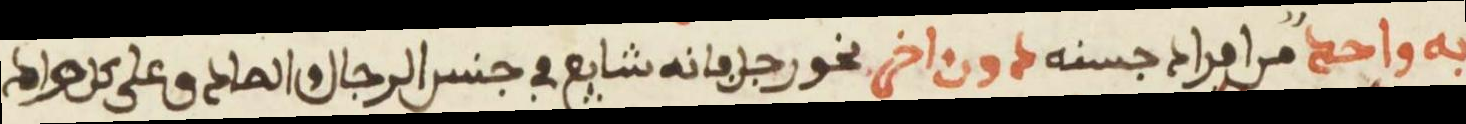به واحد من افراد جنسه دون ءاخر نحو رجل فانه شايع في جنس الرجال و الصادق و على كل واد
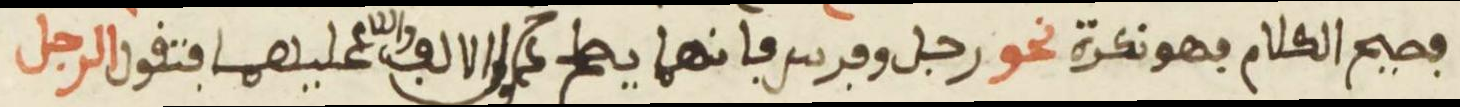فصيح الكلام فهو نكرة نحو رجل و فرس فانهما يصلح دخول الالف عليهما فتقول الرجل
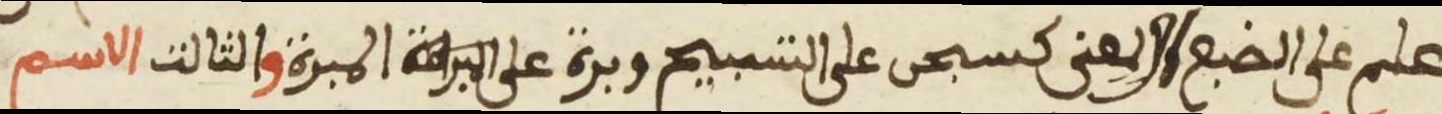علم على الضبع ### بمعنى كسبحن على التسبيح و برة على ### المبرة و الثالث الاسم
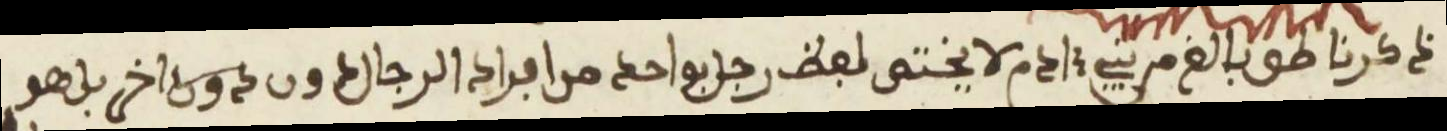ذكرنا ناطق بالغ من بني ءادم لا يختص لفظ رجل بواحد من افراد الرجال دون دون ءاخر بل هو
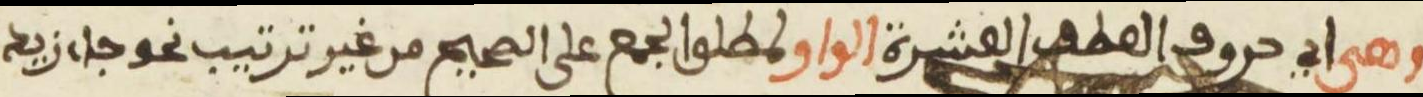و هي اي حروف العطف العشرة الواو لمطلق الجمع على الصحيح من غير ترتيب نحو جاء زيد
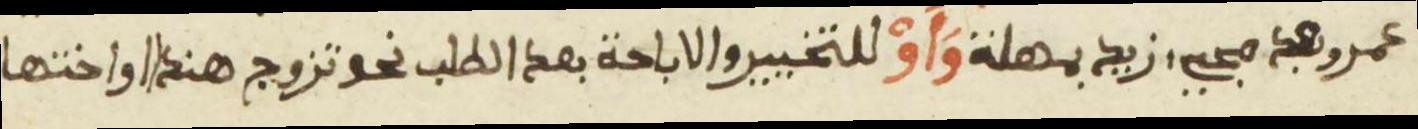عمرو بعد مجىء زيد بمهلة و أو للتخيير و الاباحة بعد الطلب نحو تزوج هندا او اختها
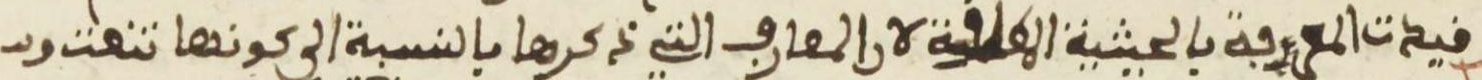قيدت المعرفة بالحيثية المطلقة لان المعارف التي ذكرها بالنسبة الى كونها تنعت و
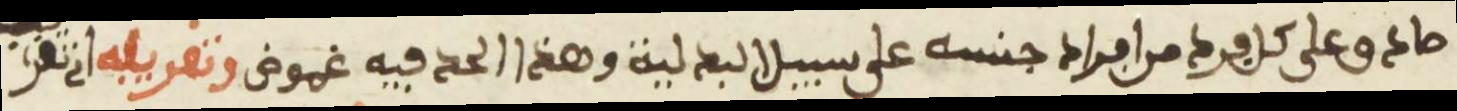صادق على كل فرد من افراد جنسه على سبيل البدلية و هذا الحد فيه غموض و تعريفه اي تقر
